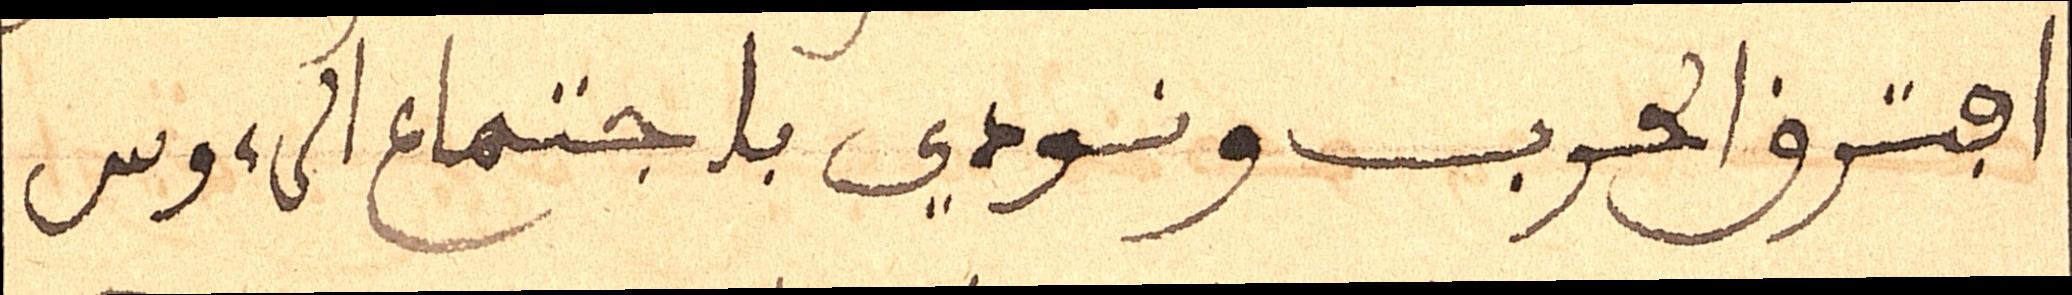افترق الحرب ونودي باجتماع الرءوس
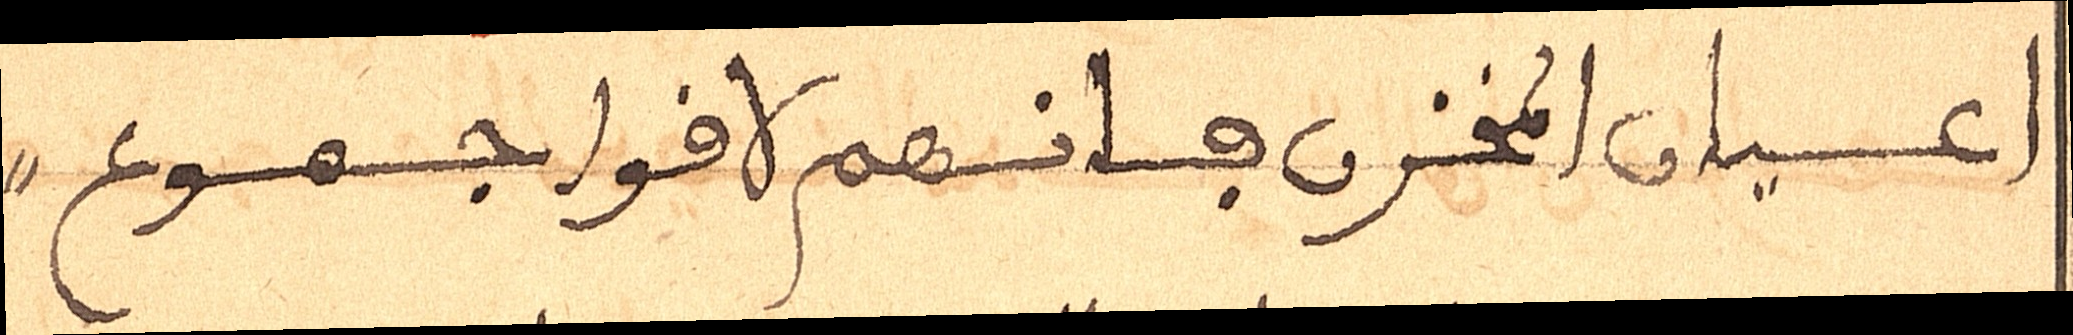اعيان المخزن فانهم لاقوا جموع
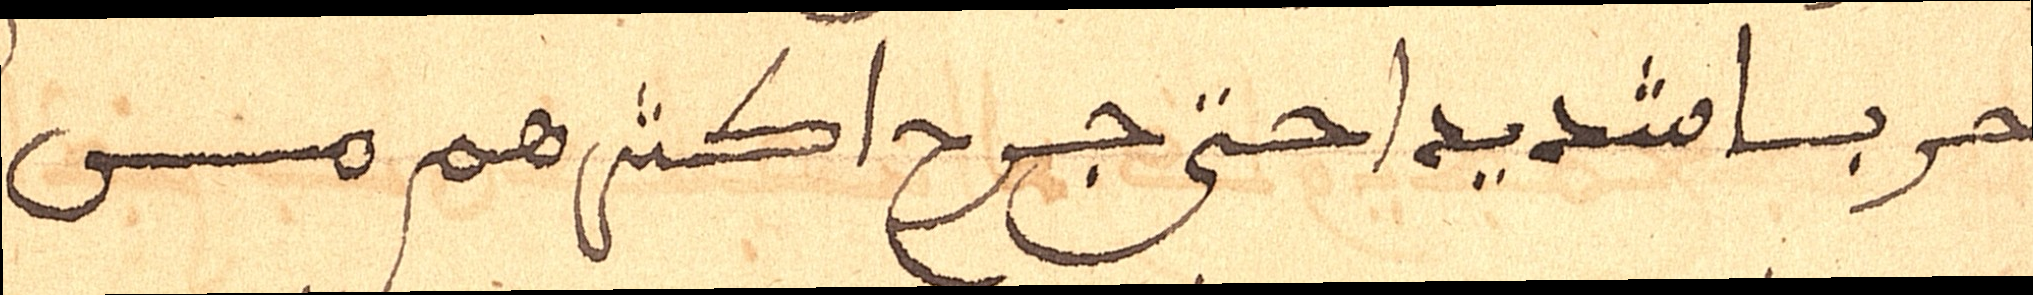حربا شديدا حتى جرح اكثرهم من
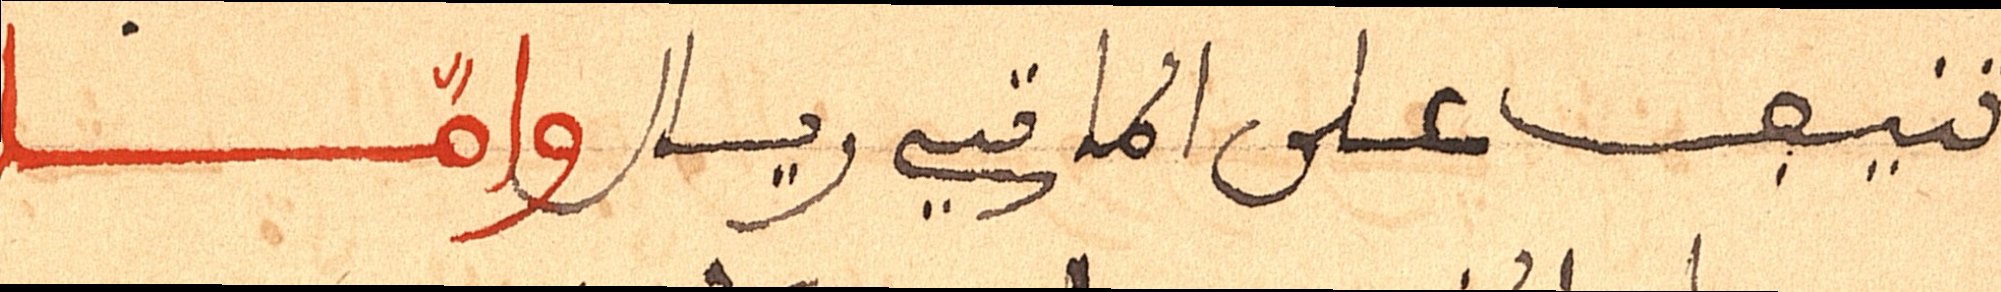تنيف على الماتي ريال واما
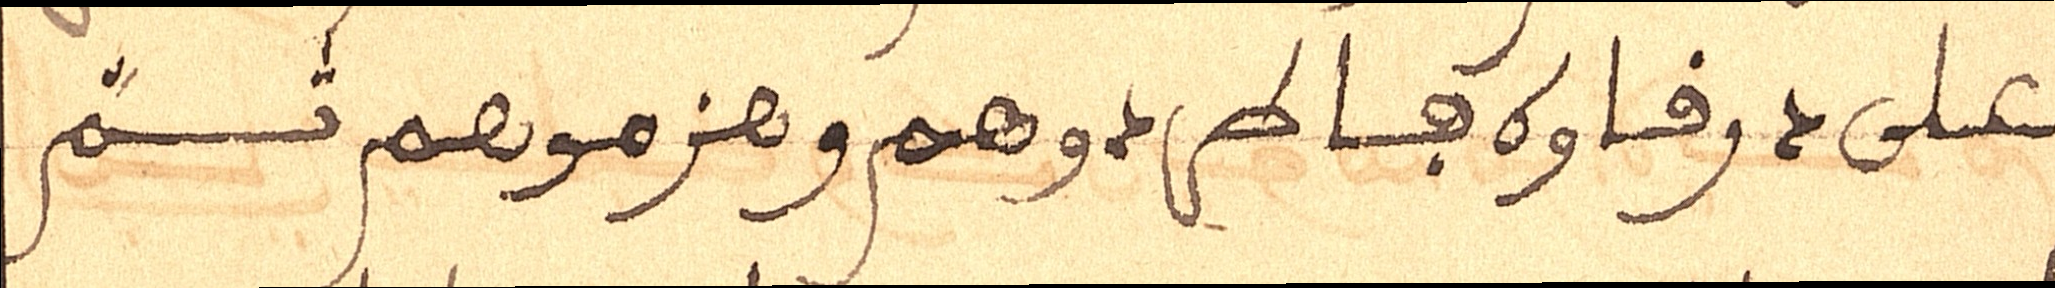على درقاوه فاطردوهم وهزموهم ثم
